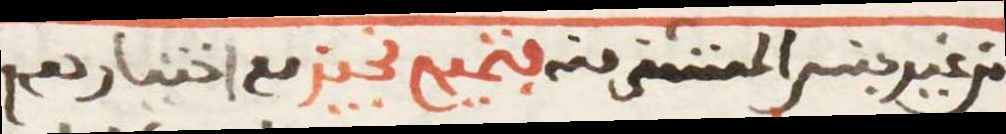من غير جنس المستثنى منه فتميم نجيز مع اختيارهم
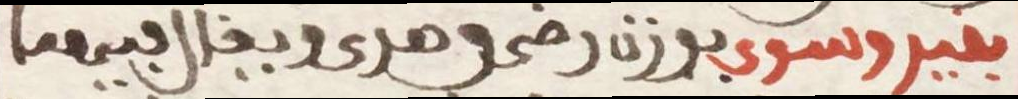بغير وسوى بوزن رضى وهدى ويقال فيهما
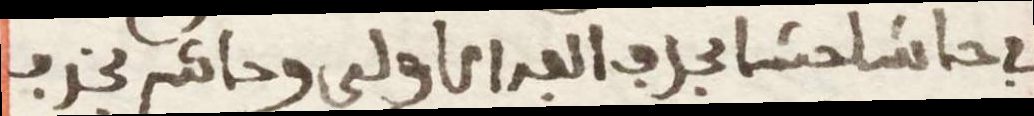في حاشا حشا محذف الفه الاولى وحاشى محذف
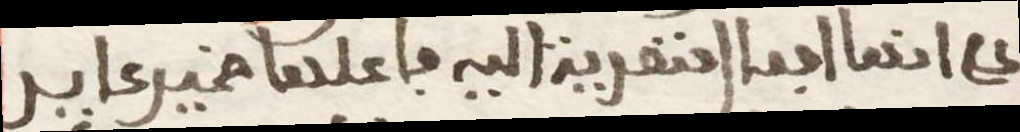على انها افعال متعدية اليه فاعلها ضمير عائد
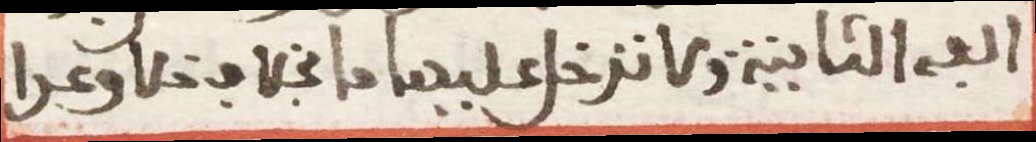الفه الثانية ولا تدخل عليهما ما بخلاف خلا وعدا
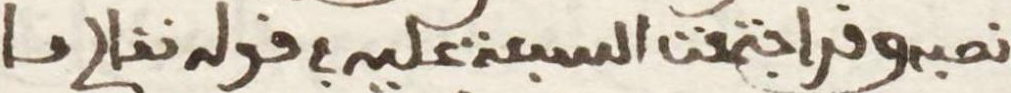نصبه وقد اجتمعت السبعة عليه في قوله تعالى ما
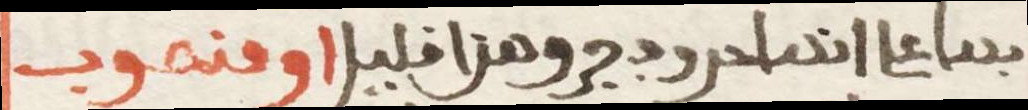بهما على انها حروف جر وهذا قليل او منصوب
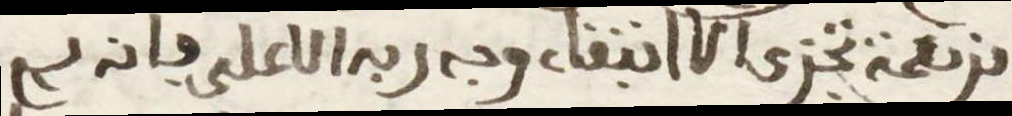من نعمة تجزى الا ابتغاء وجه ربه الأعلى فانه لم
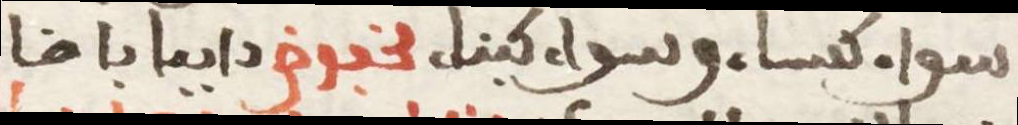سواء كمساء وسواء كبناء مخفوض دايما باضا
